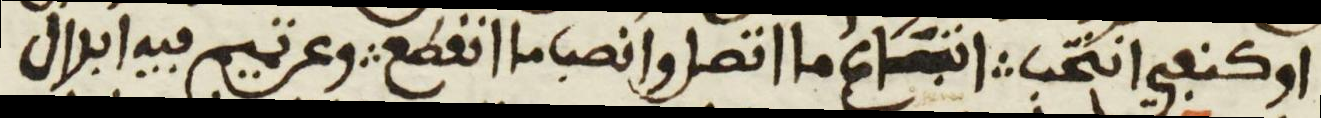او كنفي انتحب اتباع ما اتصل و انصب ما انقطع و عن تميم فيه ابدال
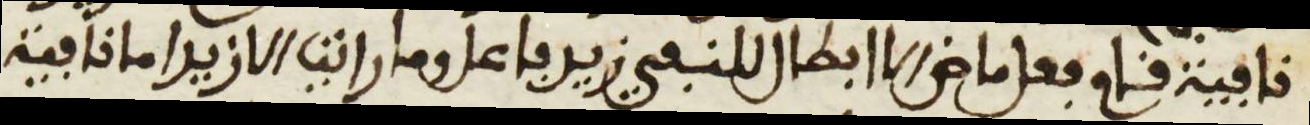نافية قام فعل ماض الا ابطال للنفي زيد فاعل و ما رايت الا زيدا ما نافية
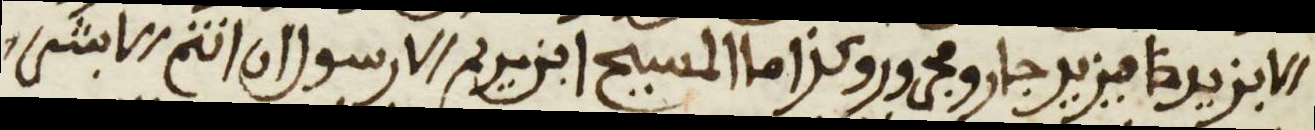الا بزيد فيزيد جار و مجرور و كذا ما المسيح ابن مريم الا رسول ان انتم الا بشرا
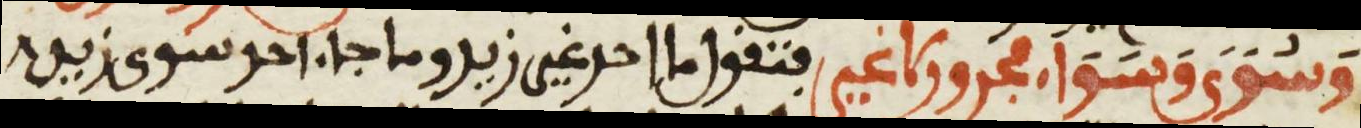و سوى و سواء مجرور لا غير فتقول ما احد غير زيد و ما جاء احد سوى زيد
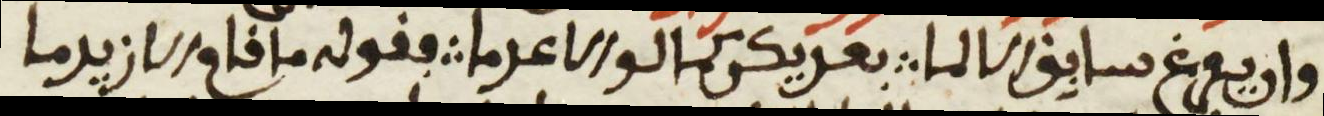و ان يفرغ سابق الا لما بعد يكن كما لو الا عدما فقوله ما قام الا زيد ما
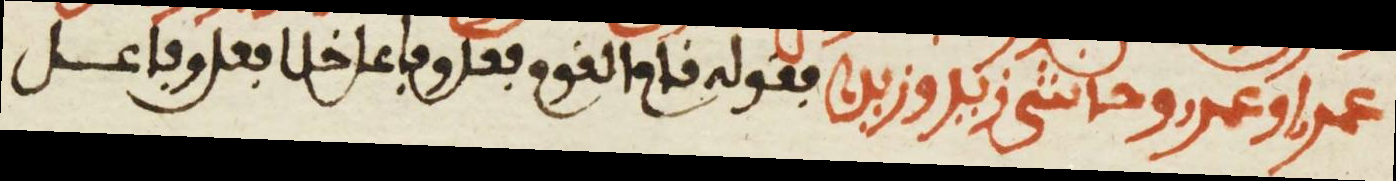عمرا و عمرو و حاشى زيد و زيدا فقوله قام القوم فعل و فاعل خلا فعل و فاعل
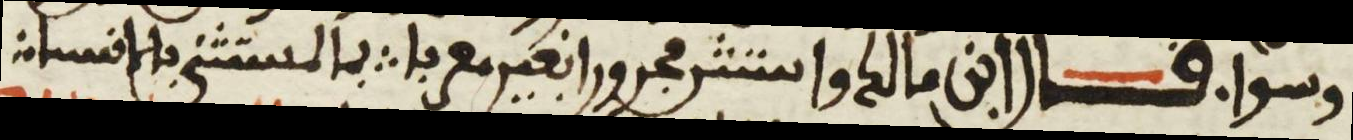وسواء قال ابن مالك واستثن مجرورا بغير معربا بما لمستثنى بالا نسان
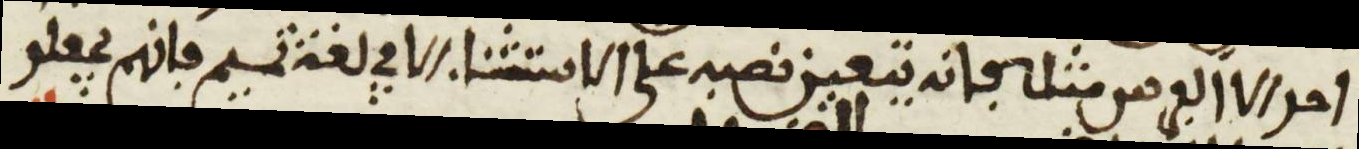احد الا الفرس مثلا فانه يتعين نصبه على الاستثناء الا في لغة تميم فانهم يجعلو
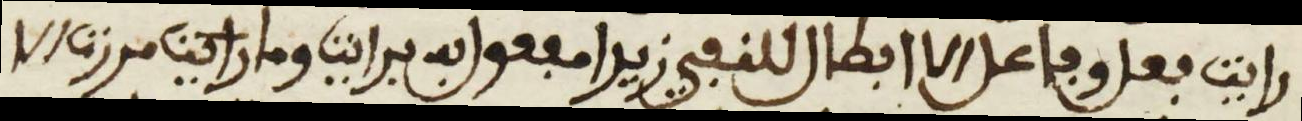رايت فعل و فاعل الا ابطال للنفي زيدا مفعول به برايت و ما رايت مررت الا
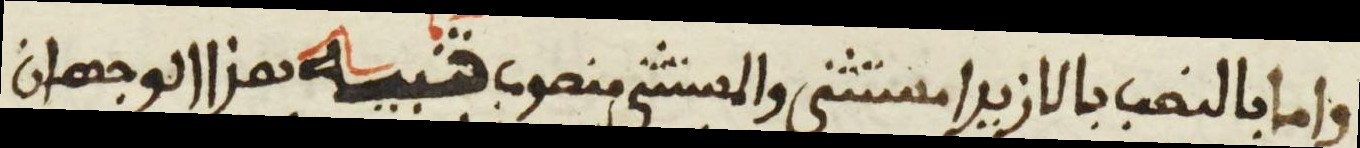واما بالنصب بالا زيدا مستثنى و المستثنى منصوب تنبيه هذا الوجهان
